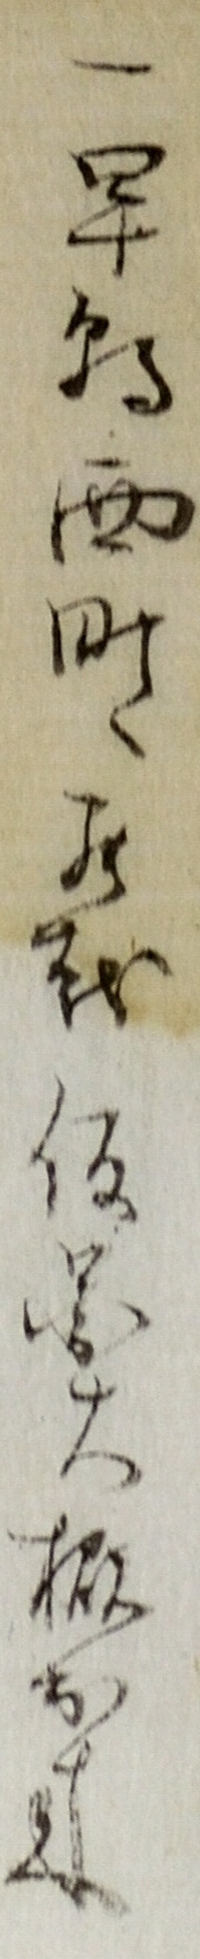一早朝西町へ罷越仮図大概出来
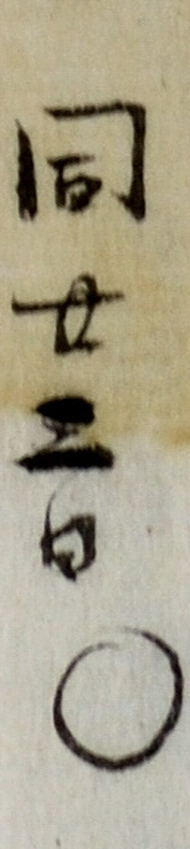同廿二日○
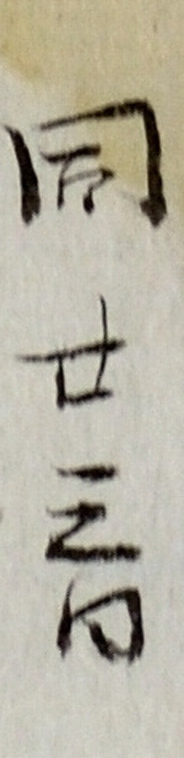同廿三日
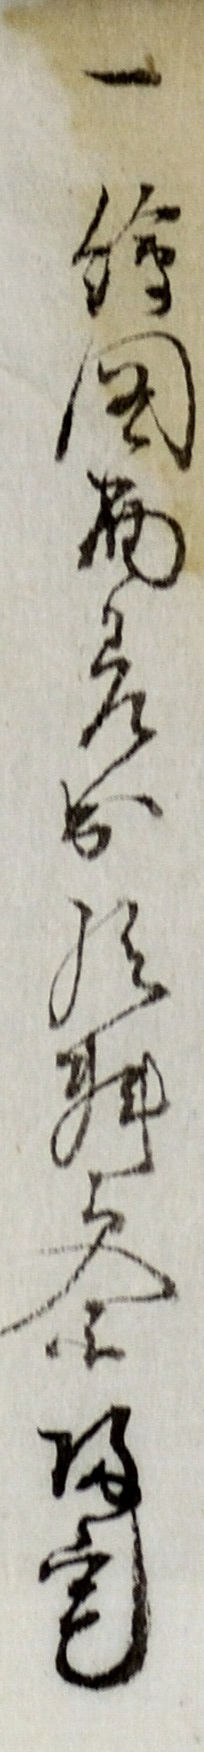一絵図面差出給料受取帰宅
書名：小出耕地新田耕地山論測量控
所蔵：伊那市立高遠町図書館・合同会社AMANE
